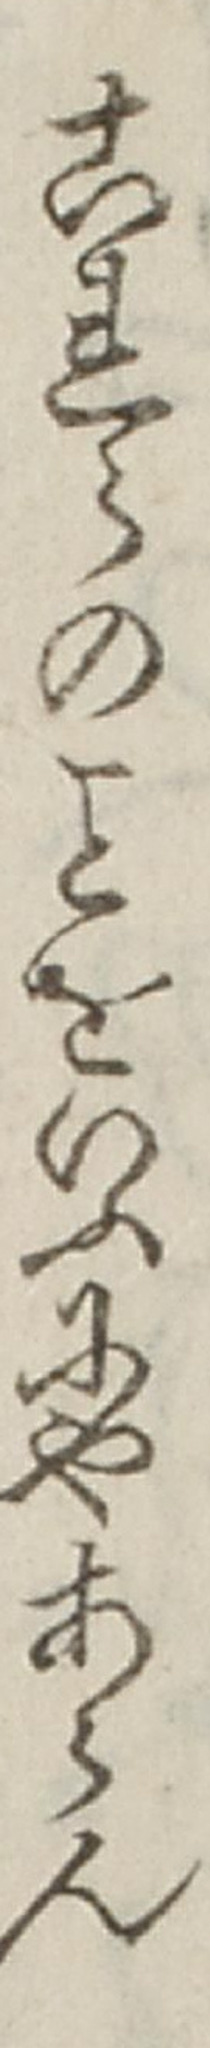これらのことをいふにやあらん
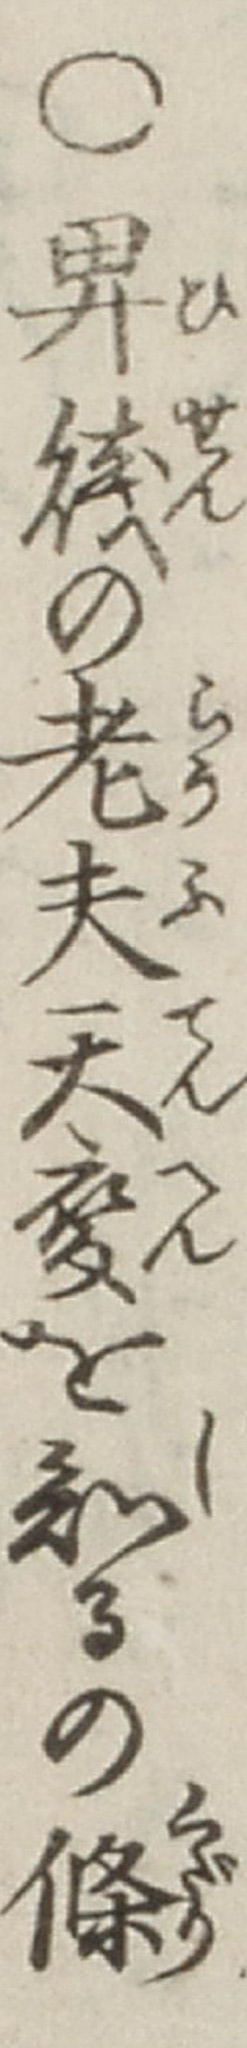○卑賤の老夫天変を知るの条
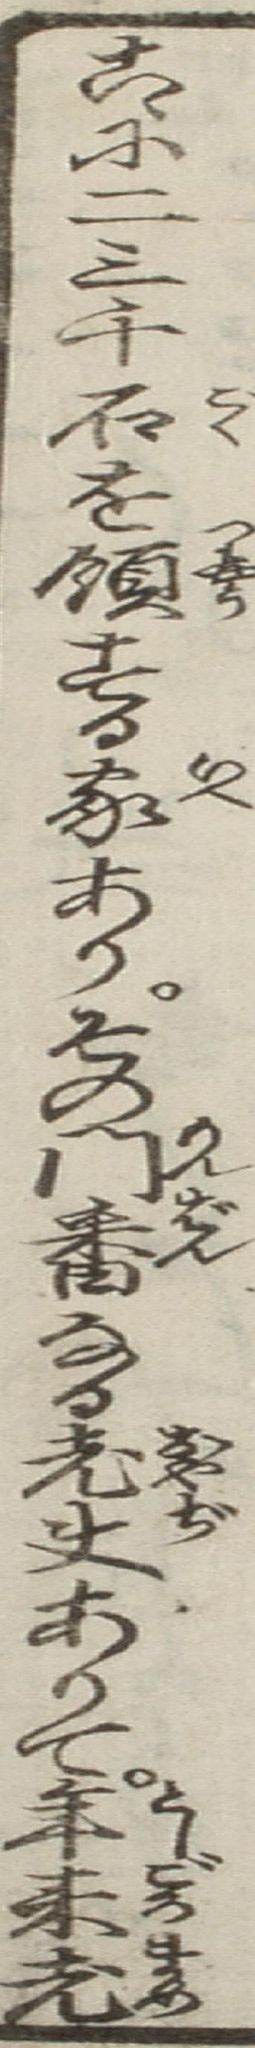こに二三千石を領する家あり。その門番なる老夫ありて。年来老
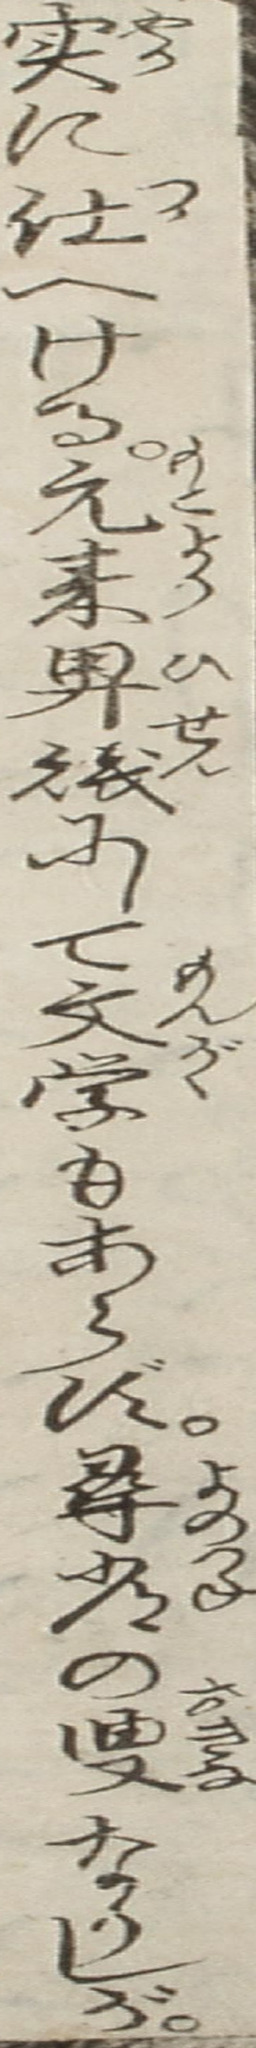実に仕へける。元来卑賤にして文学もあらず。尋常の叟なりしが。
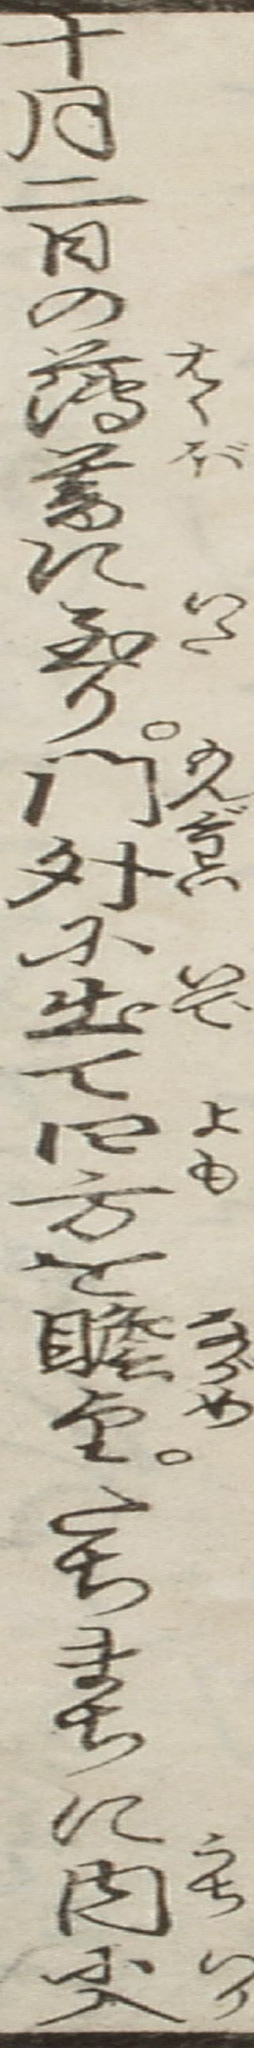十月二日の薄暮に至り。門外に出て四方を瞻望。たちまちに内に入
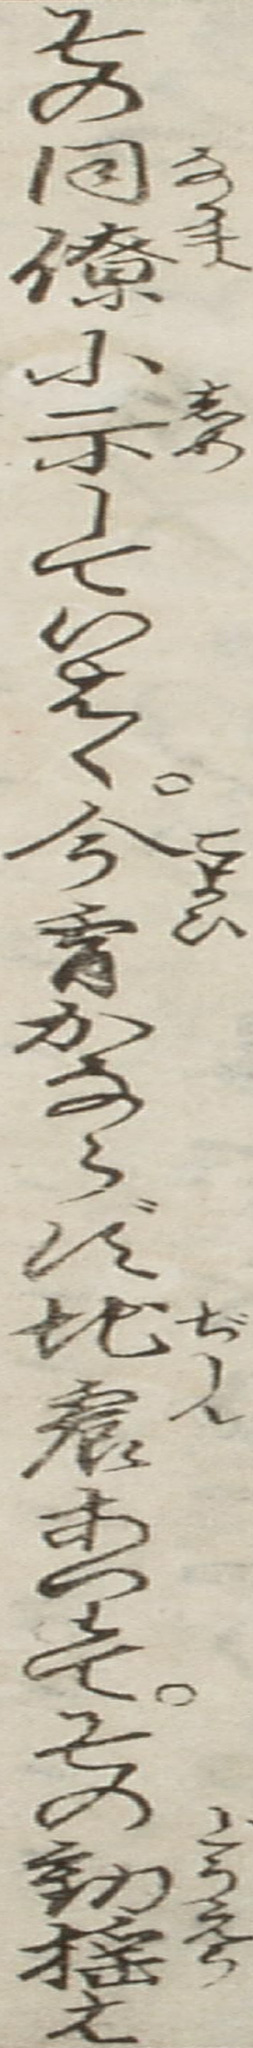その同僚に示していはく。今宵かならず地震ありて。その動揺は
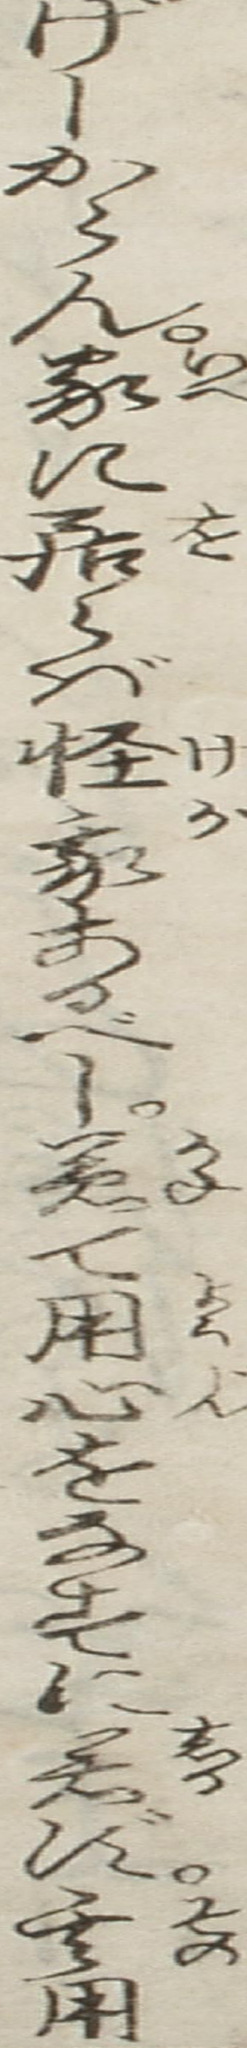げしからん。家に居らば怪我あるべし。兼て用心をなすに若ず。其用
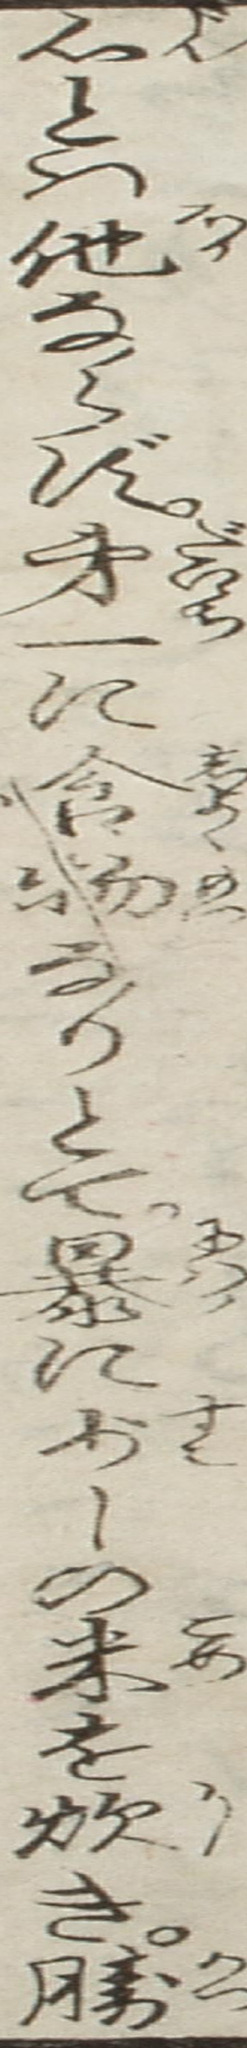心とは他ならず。第一に食物なりとて。暴に少しの米を炊き。勝
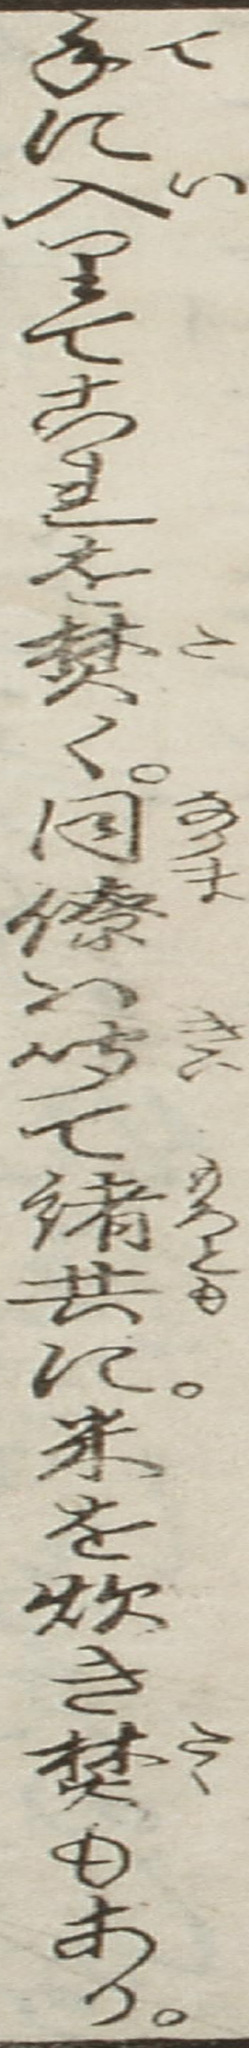手に入りてこれを焚く。同僚は聞て緒共に。米を炊き焚もあり。
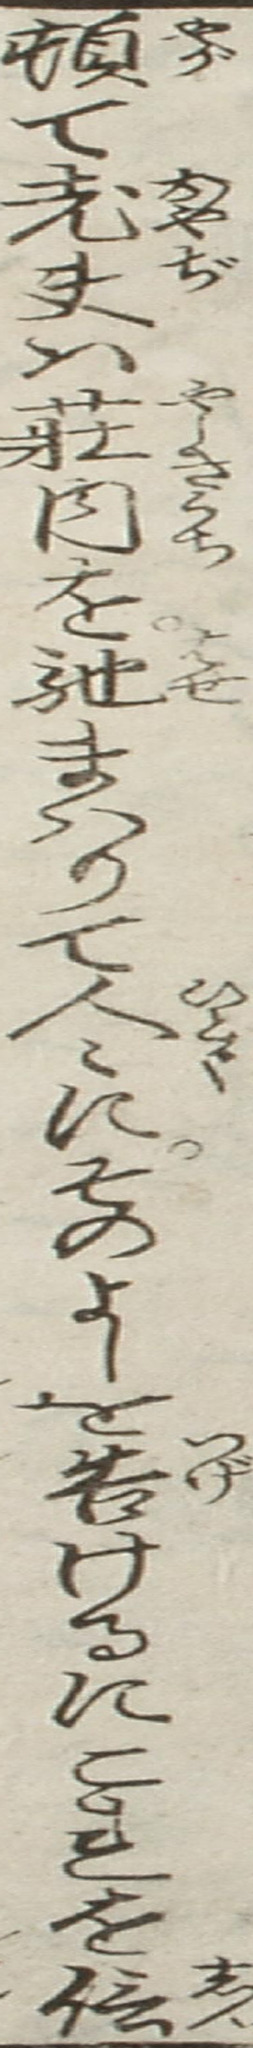頓て老夫は荘内を馳まはりて人〻に。そのよしを告けるにこれを信
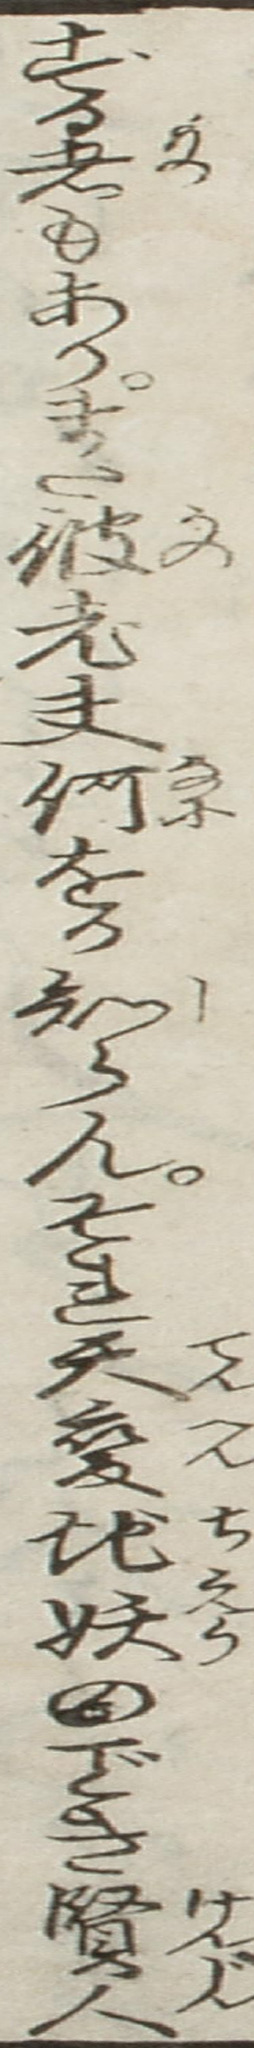ずる者もあり。また彼老夫何をか知らん。それ天変地妖のごとき賢人
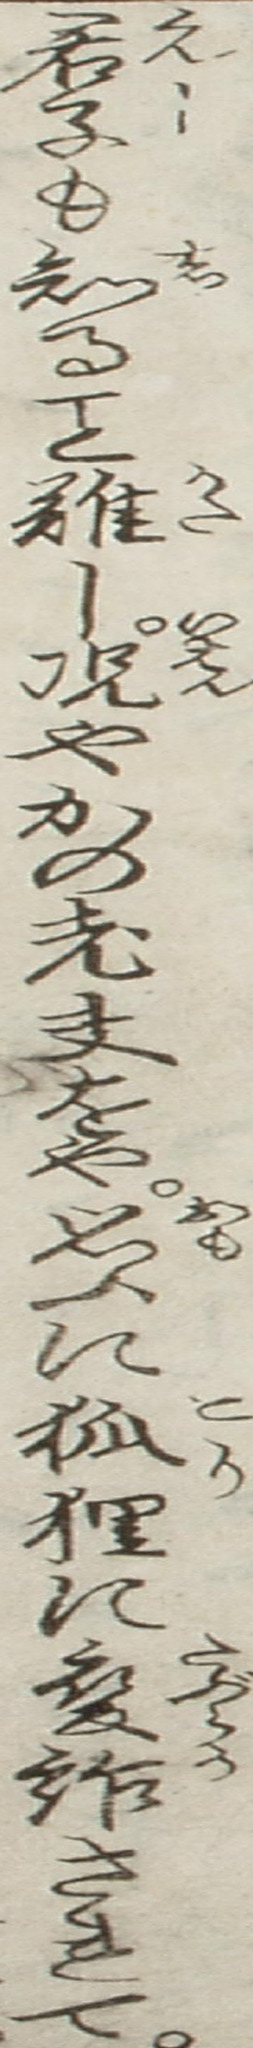君子も知ること難し。況やかの老夫をや。思ふに狐狸に変詐されて。
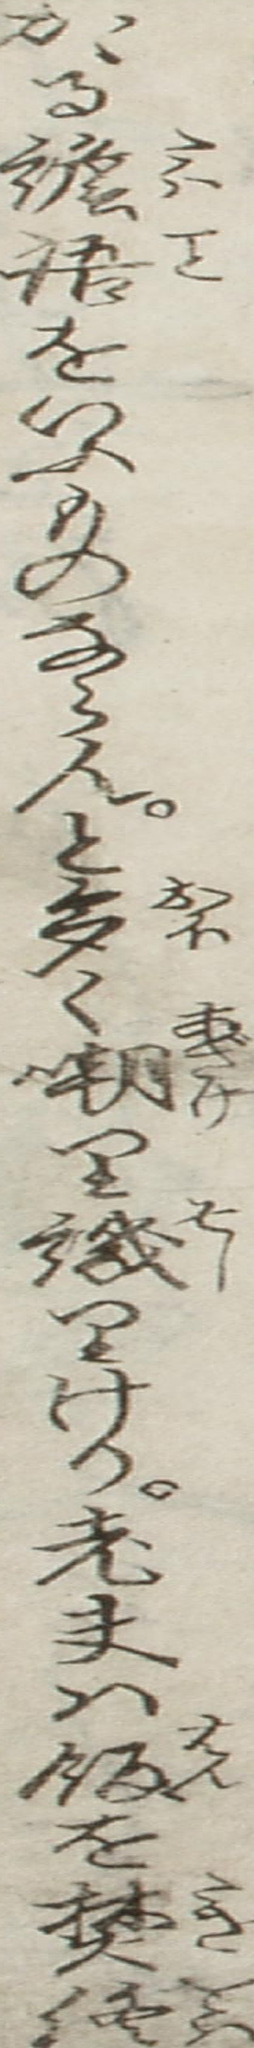かゝる譫語をいふものならん。と多く嘲り譏りけり。老夫は飯を焚終
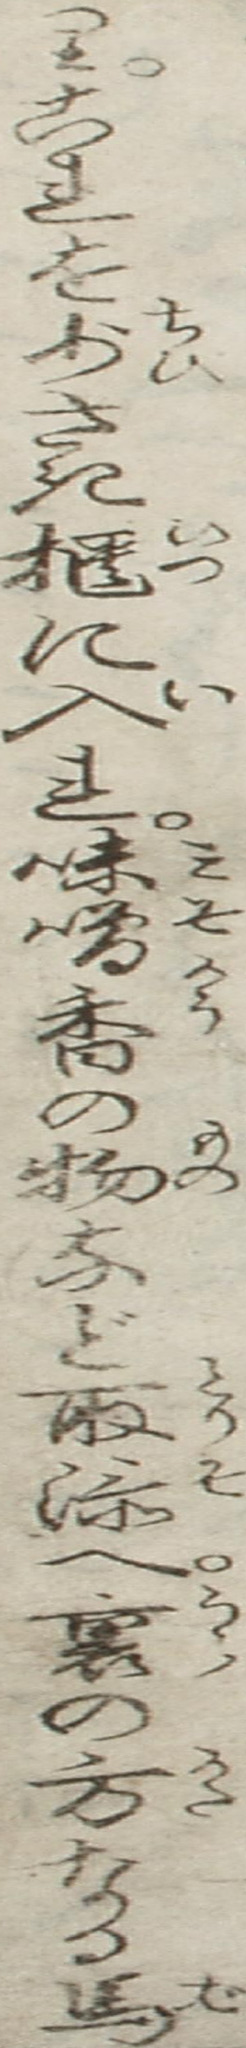り。これを少さき櫃に入れ。味噌香の物など取添へ。裏の方なる馬

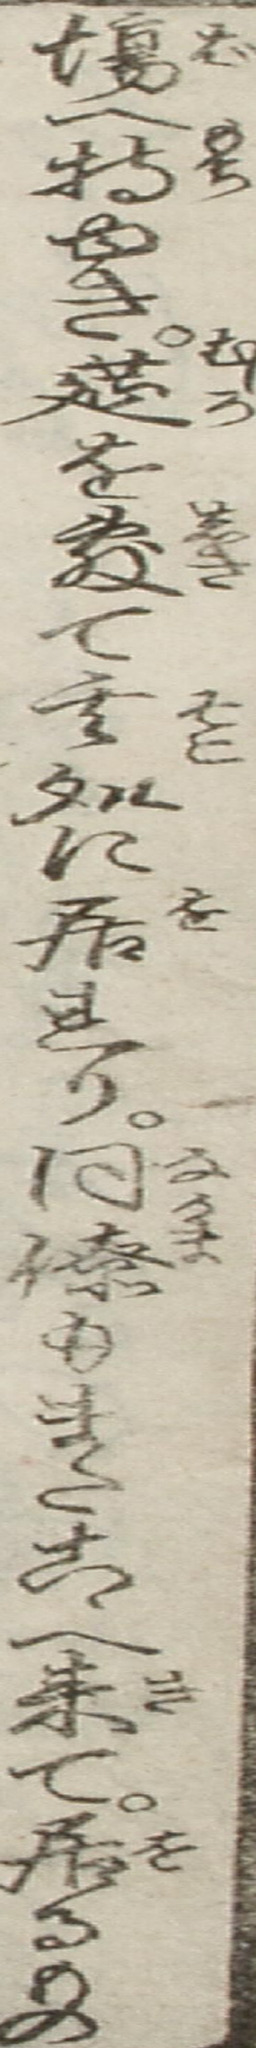場へ持ゆき。筵を敷て其処に居れり。同僚もまたこゝへ来て。居るもの
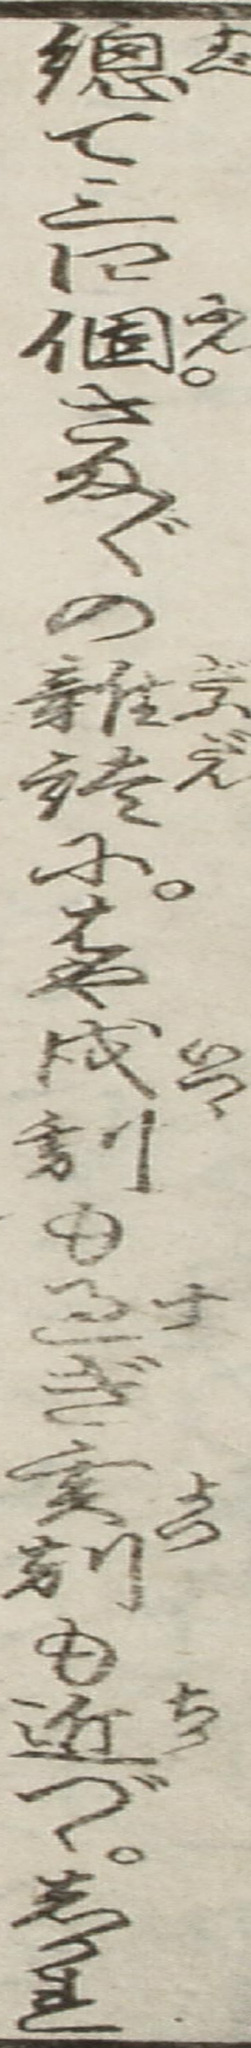總て三四個。さま〴〵の雑談に。はや戌刻も過ぎ亥刻も近づく。しかれ
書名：安政見聞録　上
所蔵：東京大学地震研究所図書室 Earthquake Research Institute Library, The University of Tokyo, JAPAN
